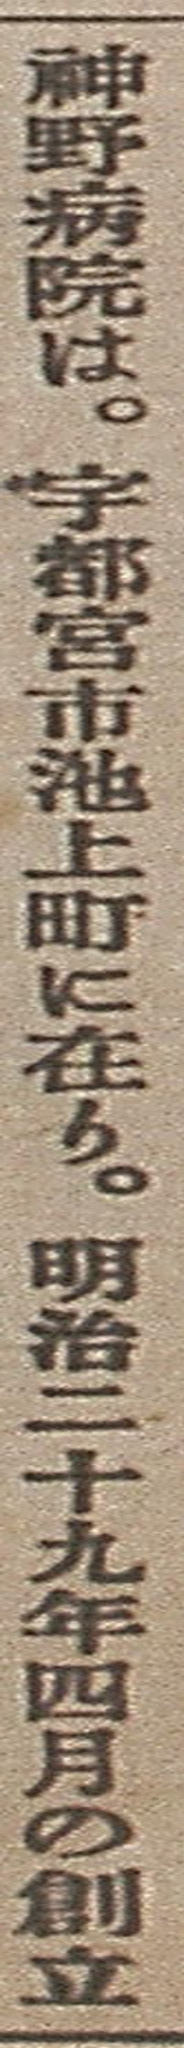神野病院は。宇都宮市池上町に在り。明治二十九年四月の創立
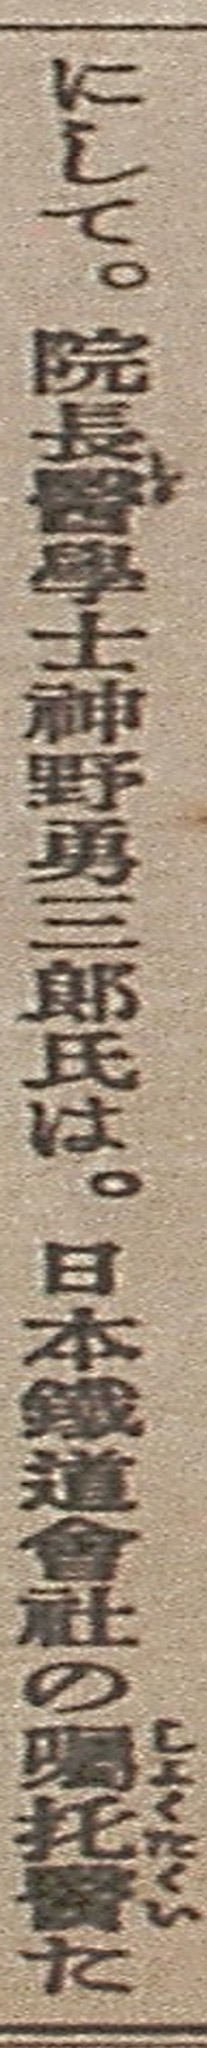にして。院長医学士神野勇三郎氏は。日本鉄道会社の嘱託医た
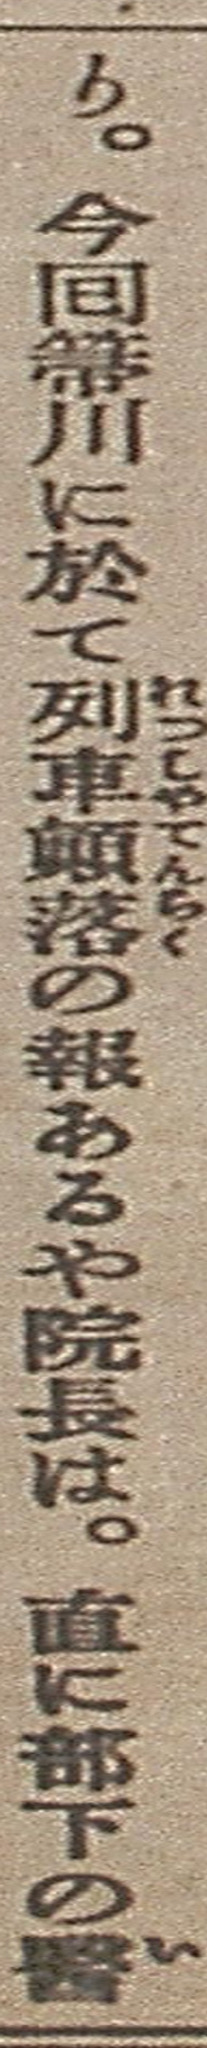り。今回箒川に於て列車顚落の報あるや院長は。直に部下の医
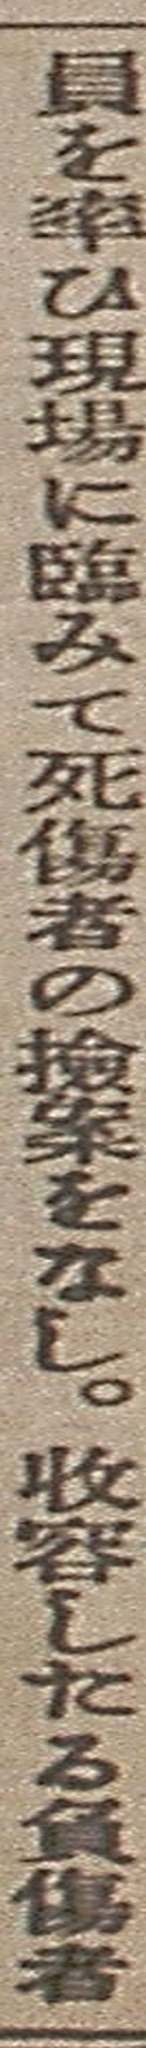員を率ひ現場に臨みて死傷者の検案をなし。収容したる負傷者
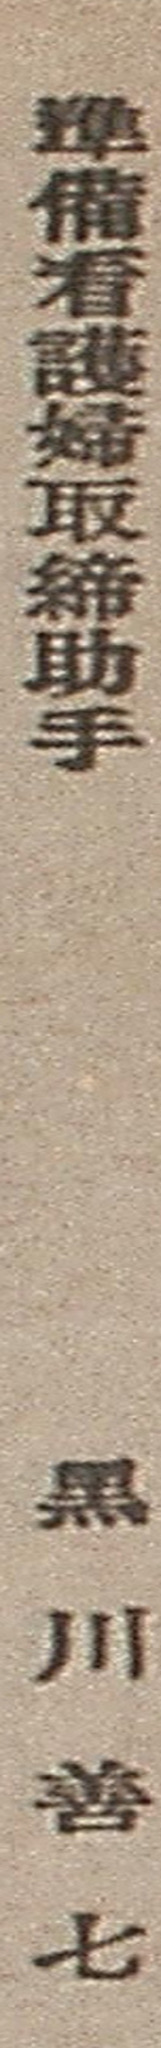準備看護婦取締助手黒川善七
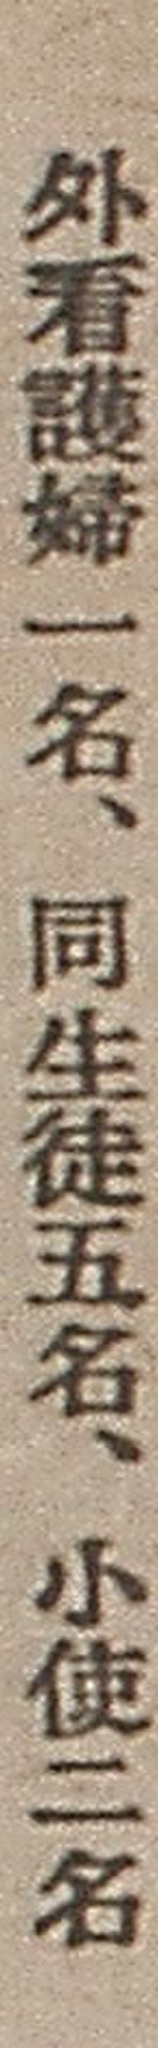外看護婦一名、同生徒五名、小使二名
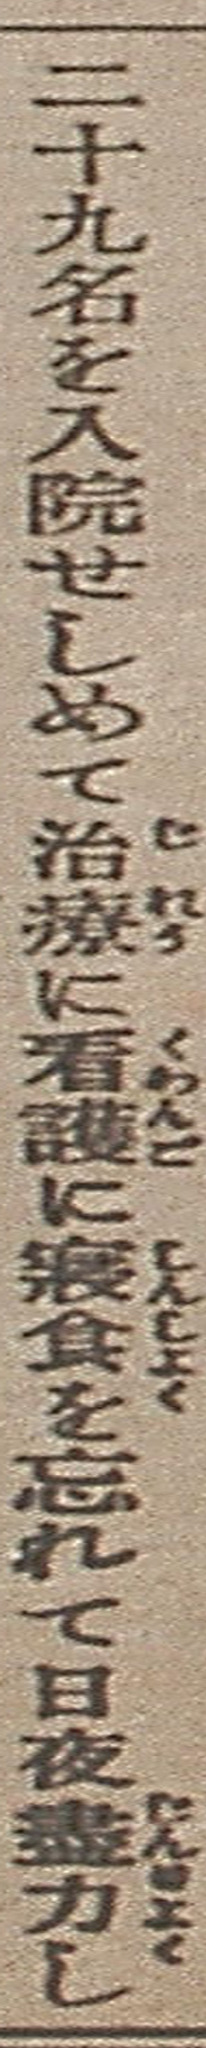二十九名を入院せしめて治療に看護に寝食を忘れて日夜尽力し
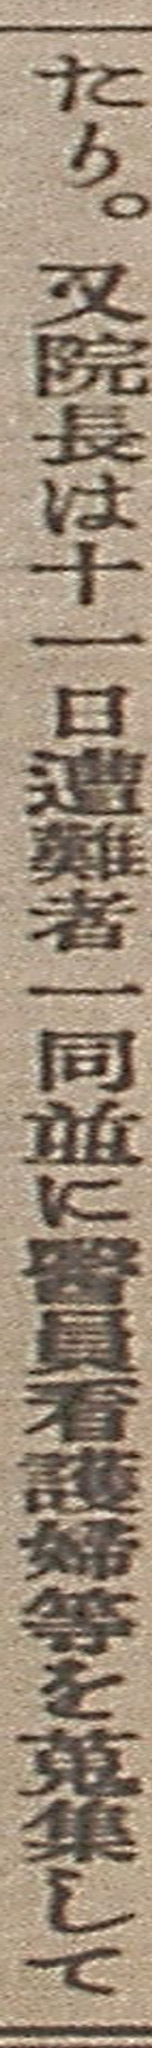たり。又院長は十一日遭難者一同並に医員看護婦等を蒐集して
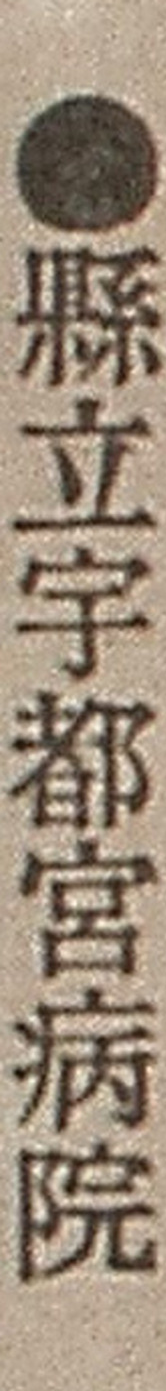●県立宇都宮病院
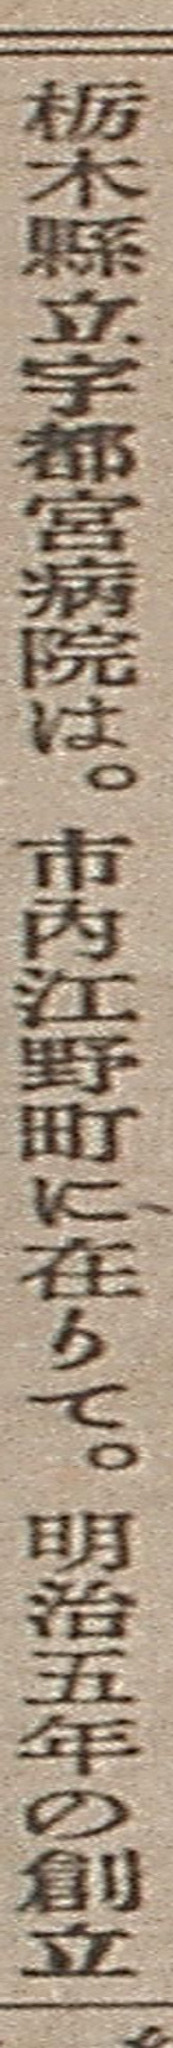栃木県立宇都宮病院は。市内江野町に在りて。明治五年の創立
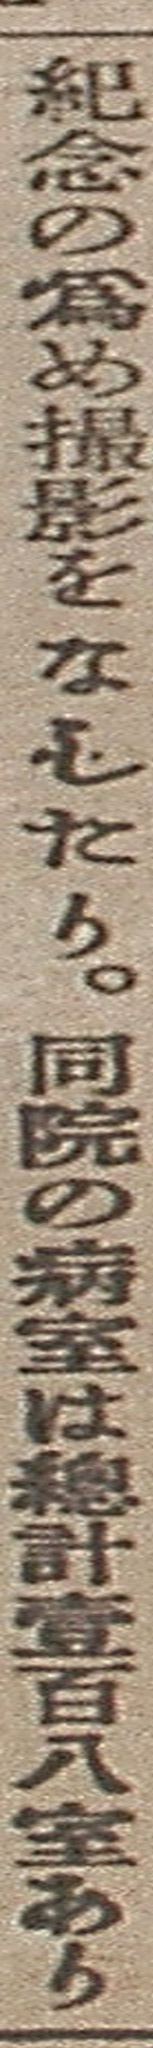記念の為め撮影をなしたり。同院の病室は総計一百八室あり
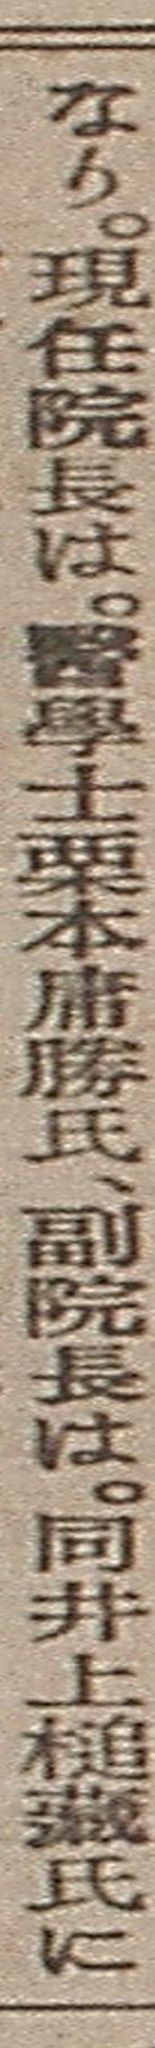なり。現在院長は。医学士栗本庸勝氏、副院長は。同井上槌蔵氏に
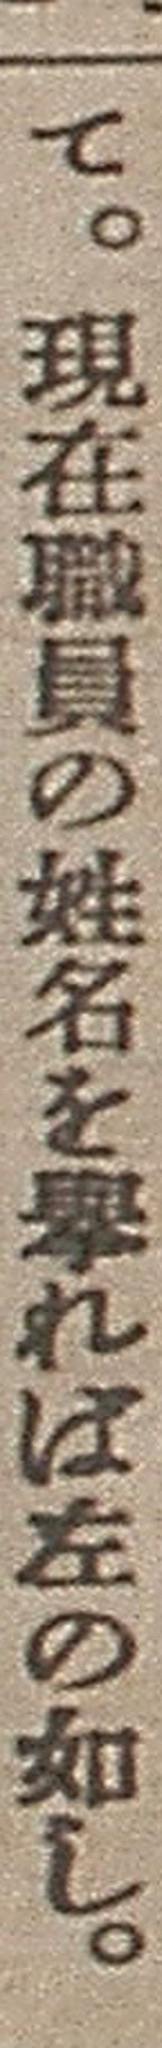て。現在職員の姓名を挙れば左の如し。
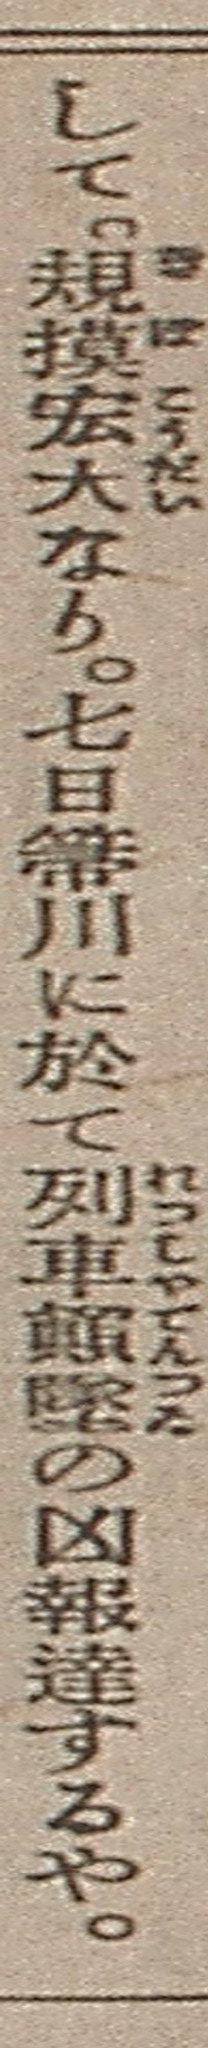して。規模宏大なり。七日箒川に於て列車顚墜の凶報達するや。
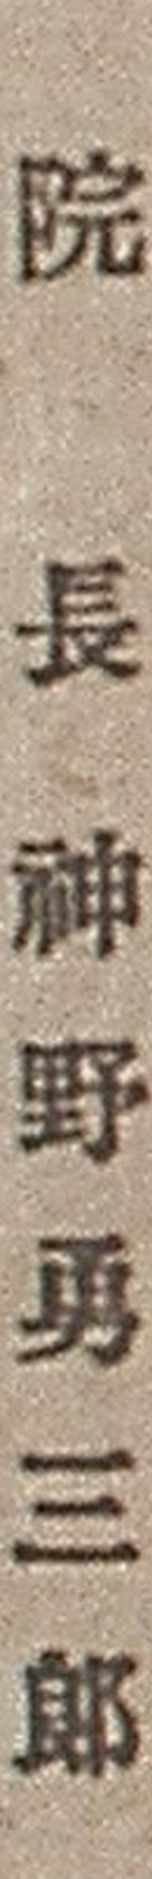院長神野勇三郎
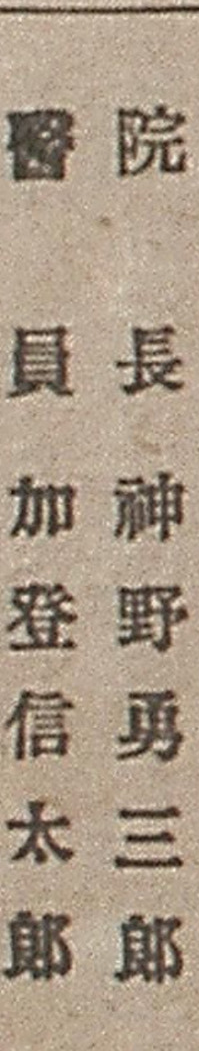院長神野勇三郎
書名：風俗畫報臨時増刊第百九十九號　明治三十二年十月各地災害圖會（前編之續）
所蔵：東京大学地震研究所図書室 Earthquake Research Institute Library, The University of Tokyo, JAPAN
